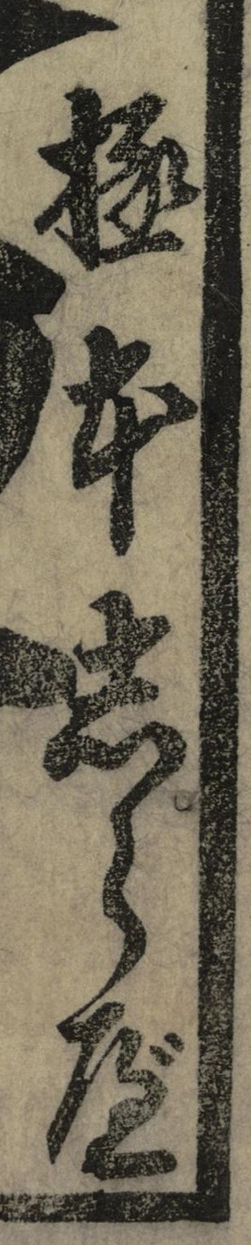并極本しらべ
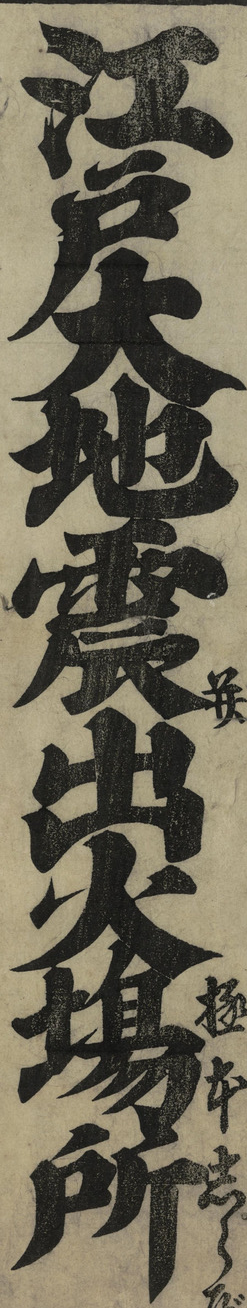江戸大地震出火場所
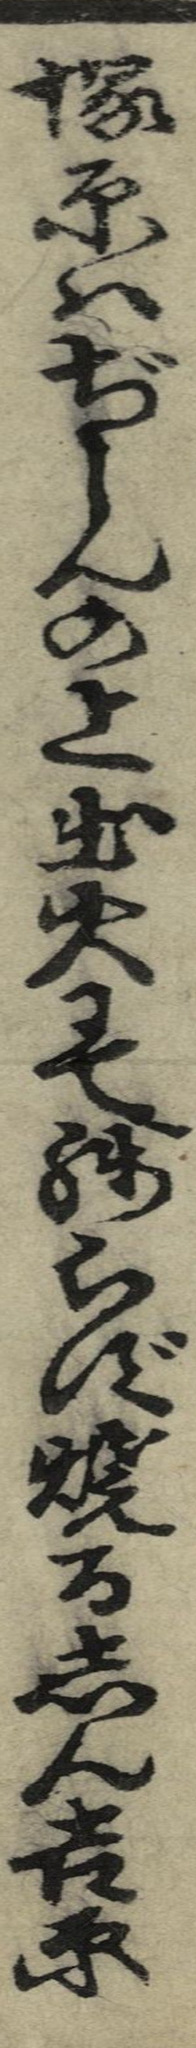塚原はぢしんの上出火にて残らず焼るしん吉原
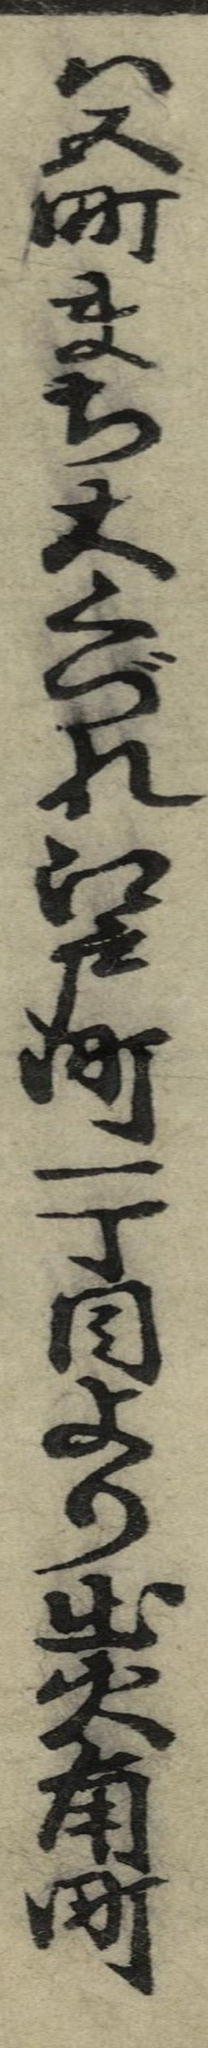は五町まち大くづれ江戸町一丁目より出火角町
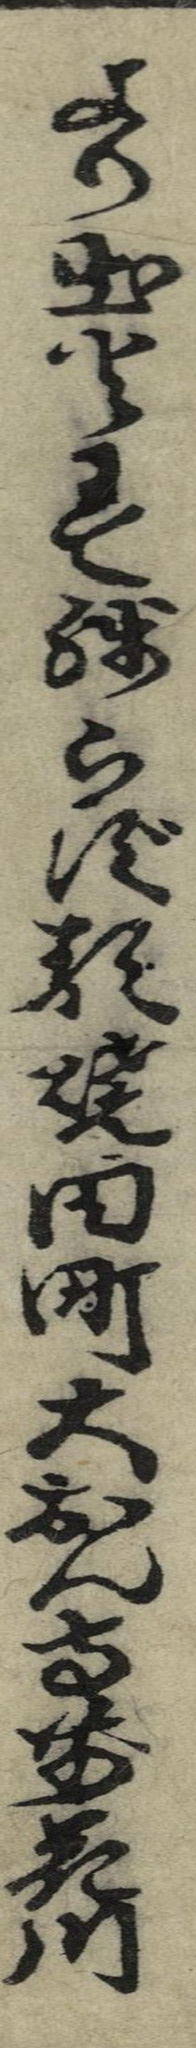より出火にて残らず類焼田町大おん寺前花川
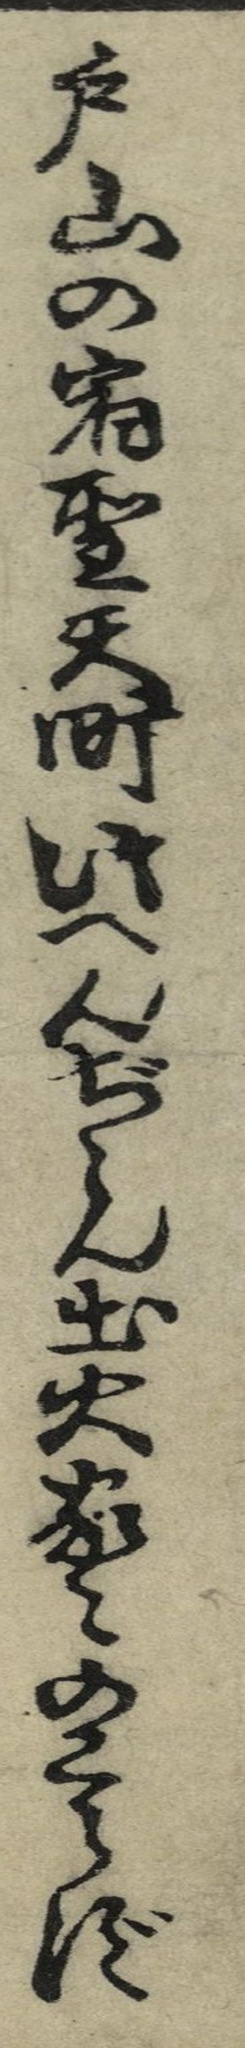戸山の宿聖天町此へんぢしん出火家〻のこらず
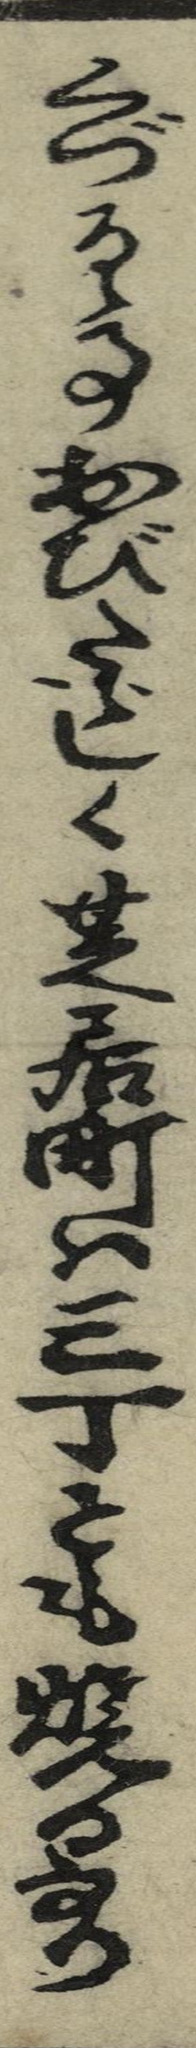くづるゝ事おびたゞしく芝居町は三丁とも焼るなり
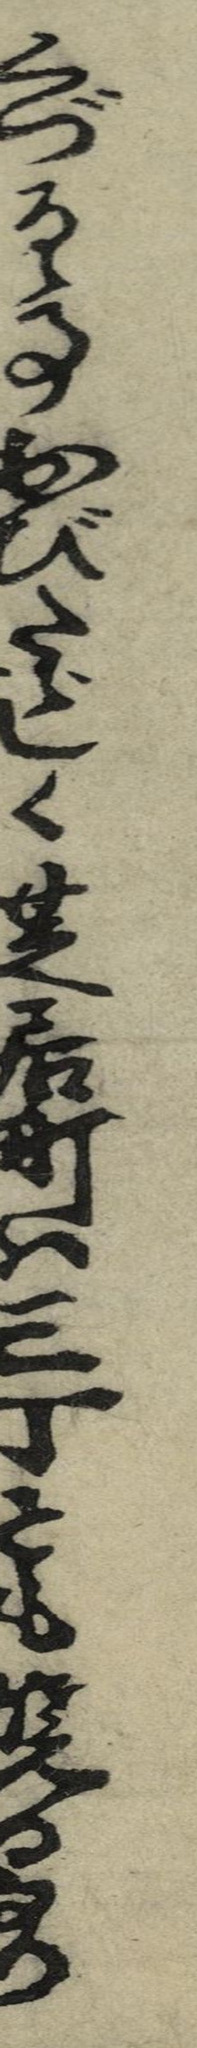くづるゝ事おびたゞしく芝居町は三丁とも焼るなり
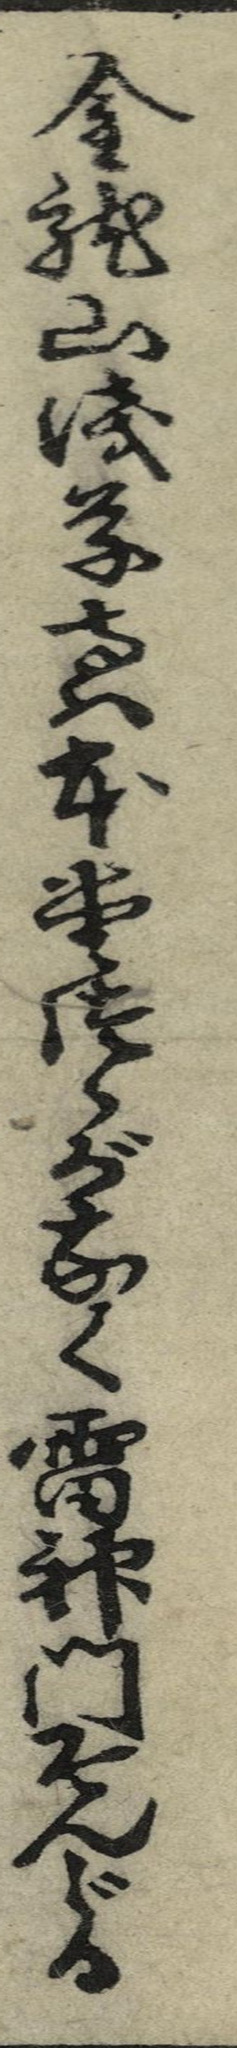金龍山浅草寺は本堂つゝがなく雷神門そんじる深川
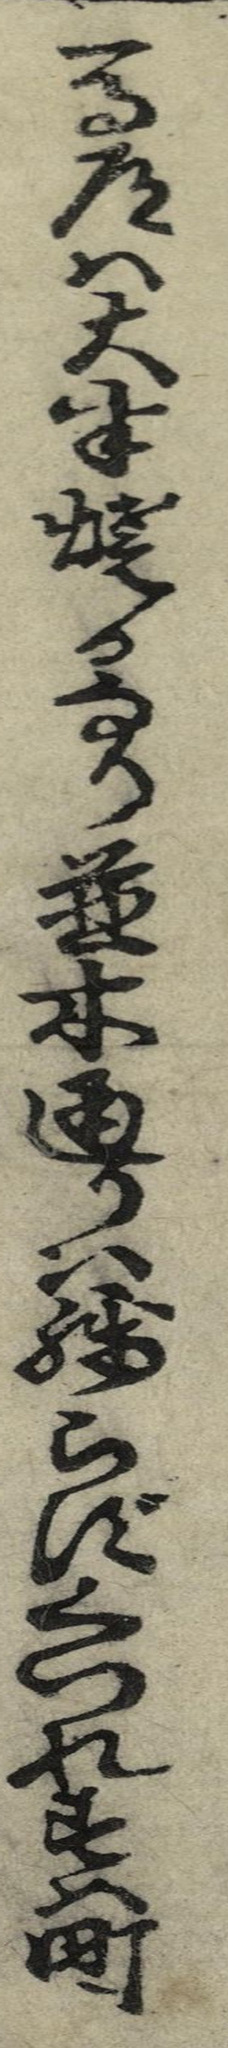馬道は大半焼るなり並木通りは残らずくつれすは町
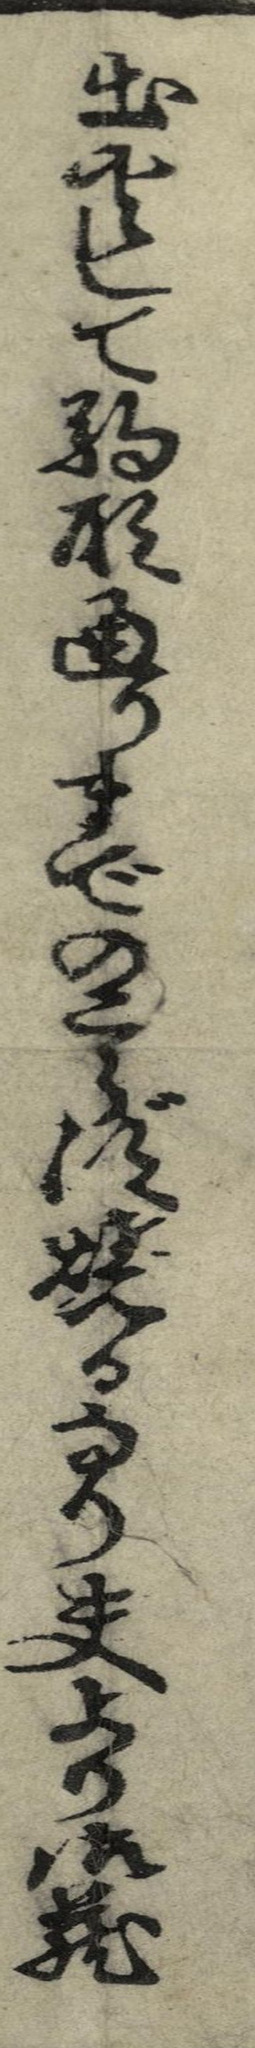出火して駒形通りまでのこらず焼るなり夫より御蔵
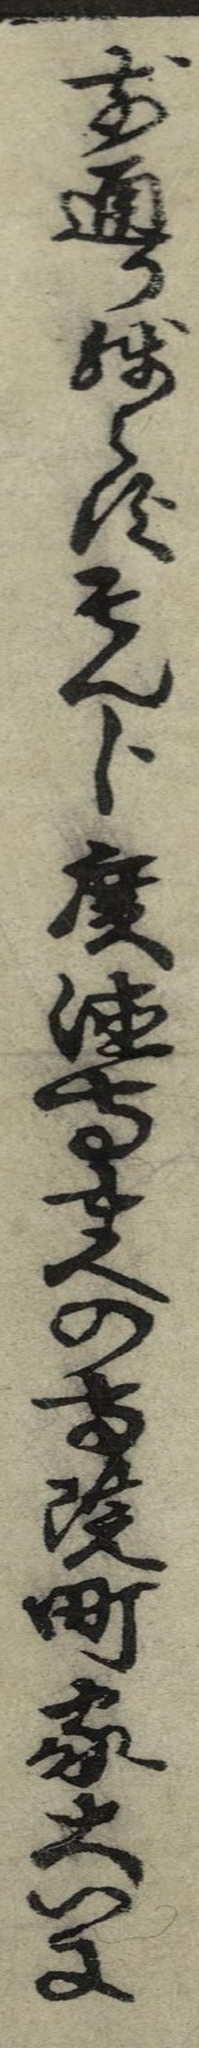前通り残らずそんじ廣徳寺まへの寺院町家大いに
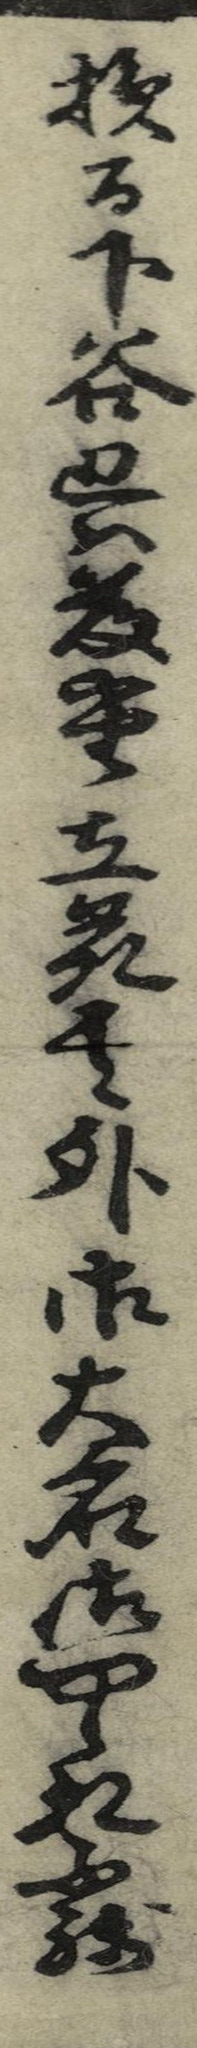損る下谷辺はゟ藤堂立花其外御大名御やしき不残
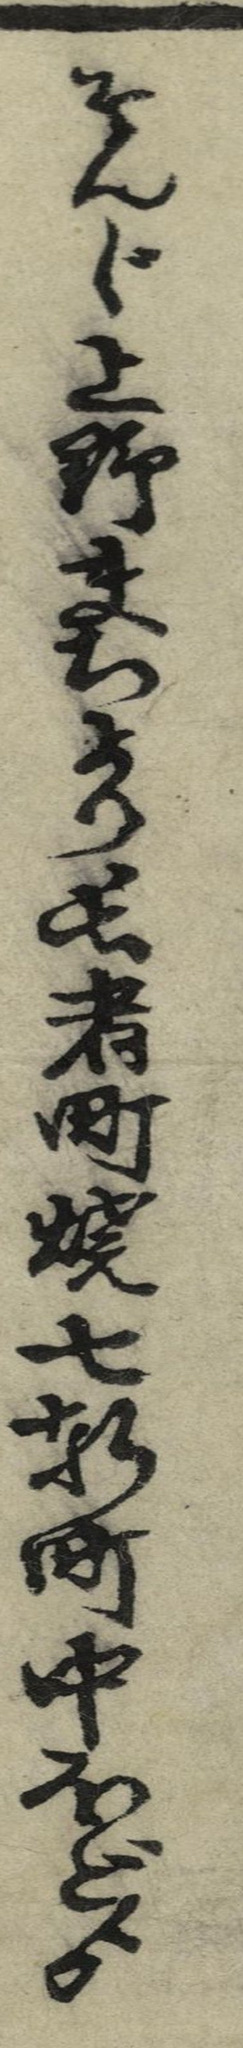そんじ上野まちより長者町焼七軒町中ほどゟ
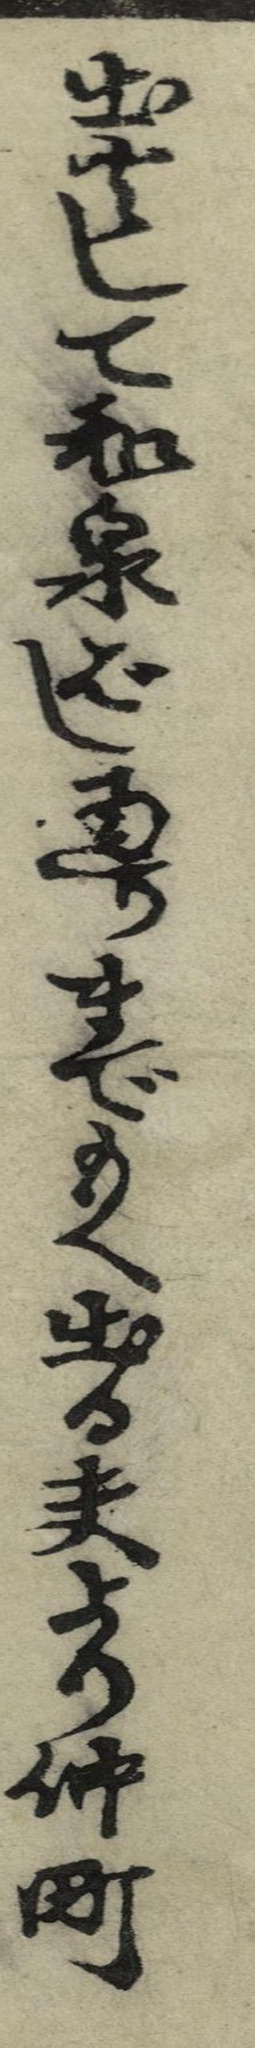出火して和泉ばし通りまでもく出る夫より仲町本所
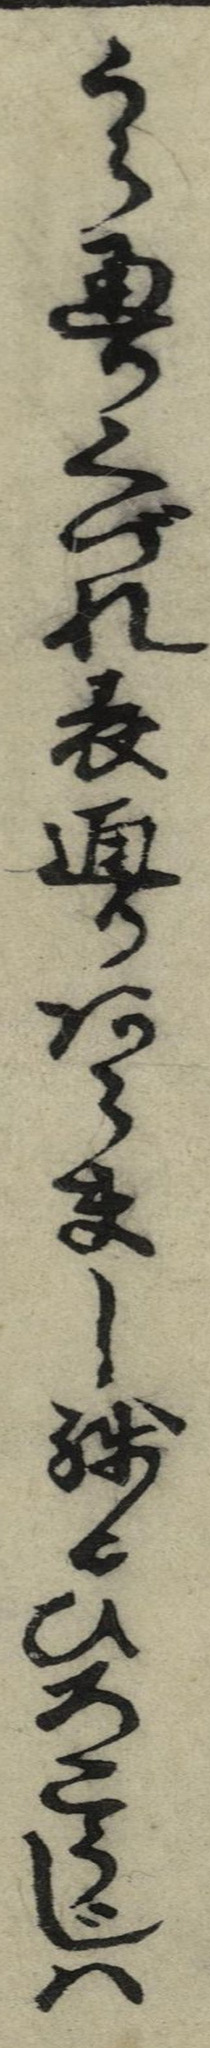くら通りくづれ表通りあらまし残るひろこうじは
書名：江戸大地震并出火場所極本しらべ
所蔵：東京大学地震研究所図書室 Earthquake Research Institute Library, The University of Tokyo, JAPAN
